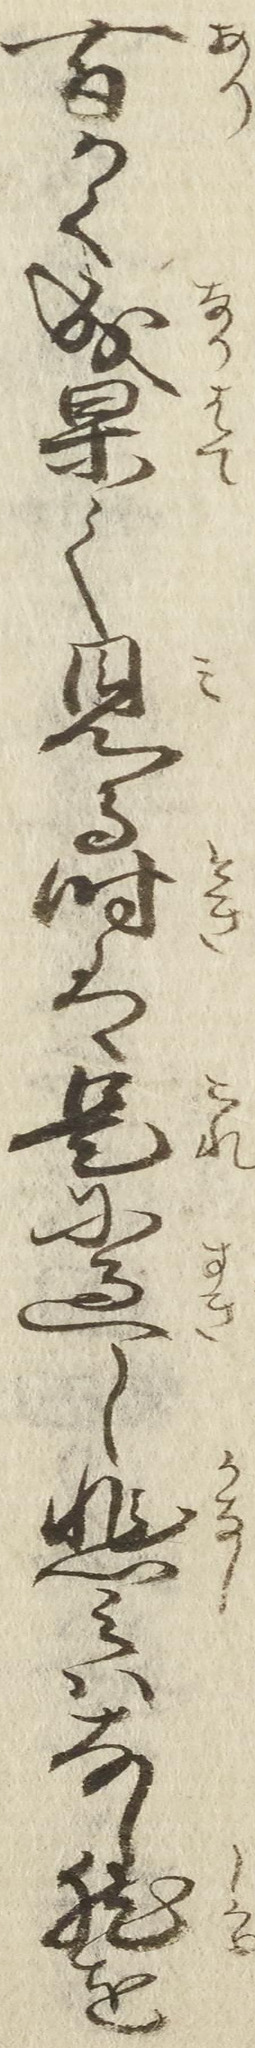有かく成果て見る時は是に過し悲みはなし然を
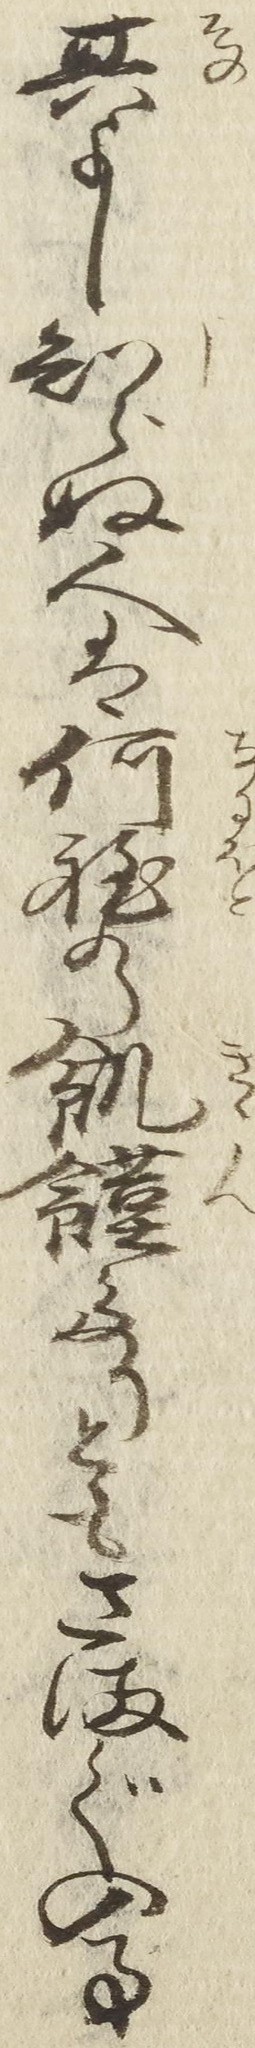其よし知らぬ人は何程の飢饉たりともさまでの事
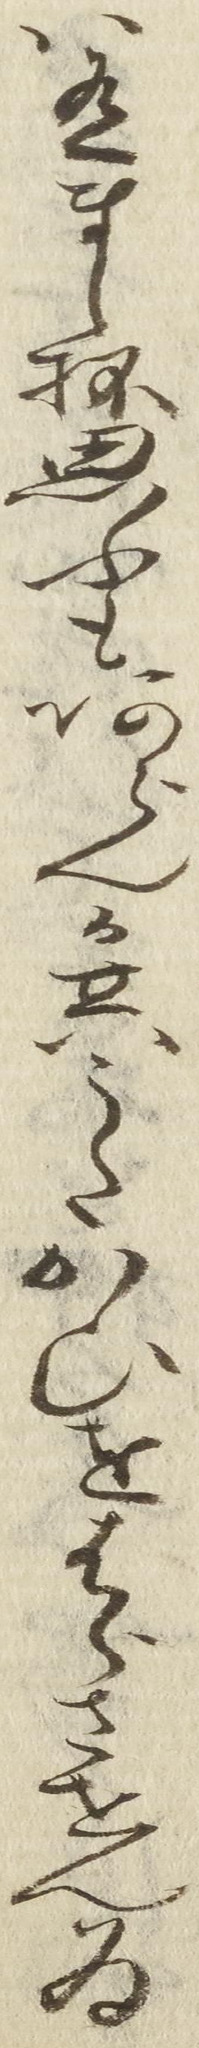は有まし抔思ふもあらんか其うたかひをはらさせん為
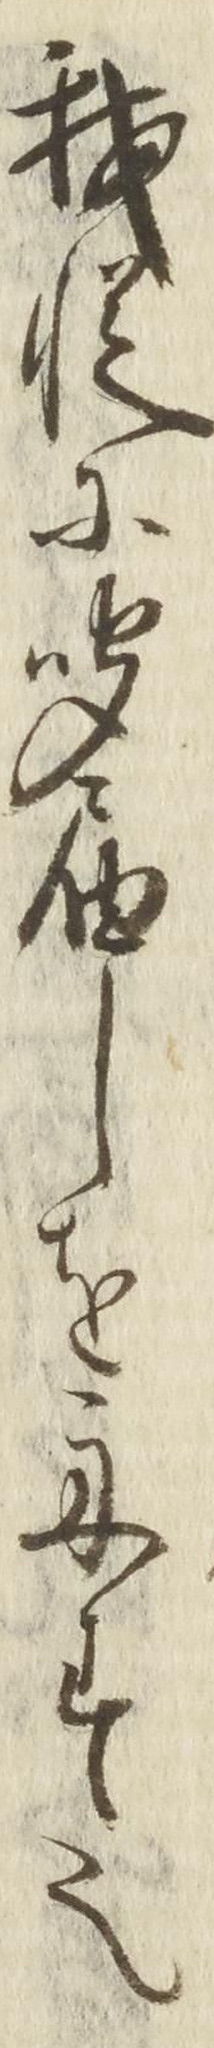我慥に聞届しを示す也
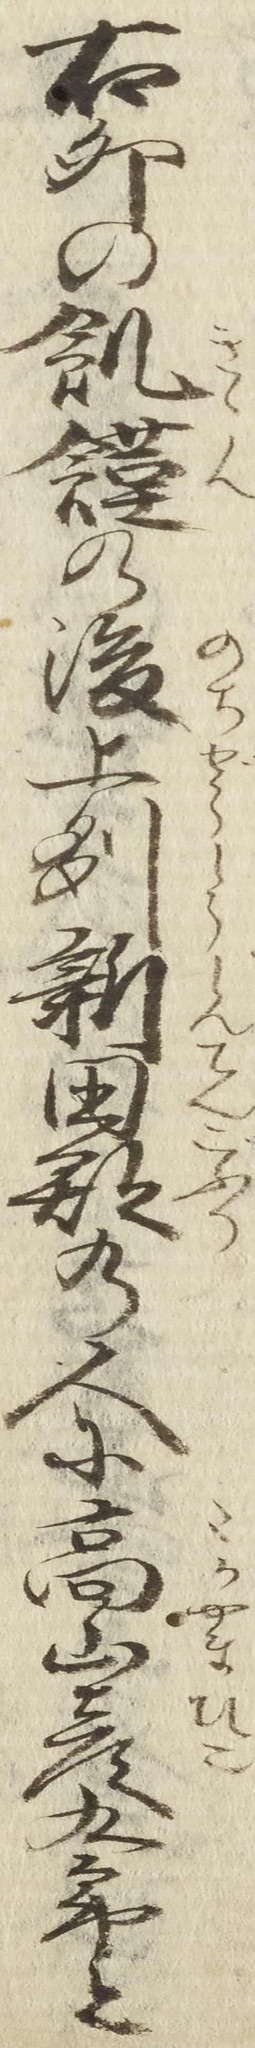右卯の飢饉の後上州新田郡の人に高山彦九郎と

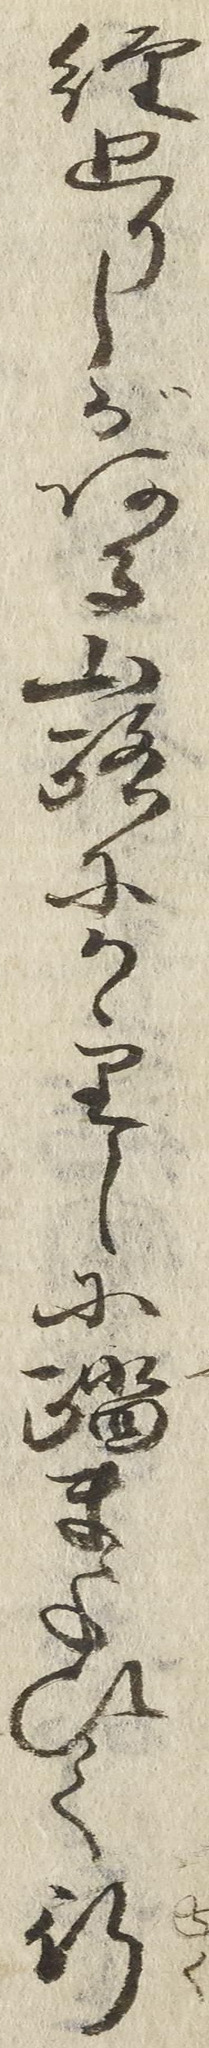経廻りしがある山路にかゝりしに踏まよひて行
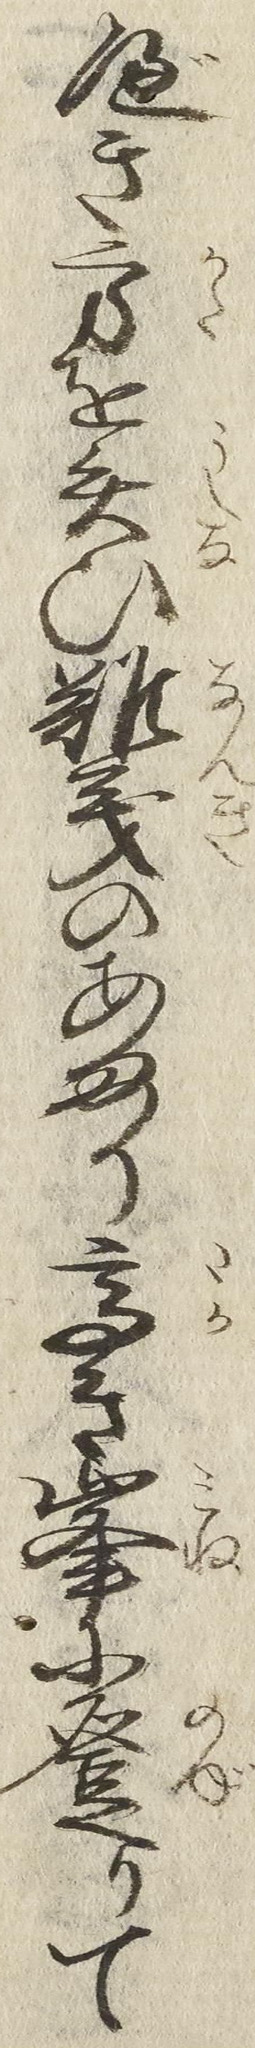べき方を失ひ難義のあまり高き峯に登りて
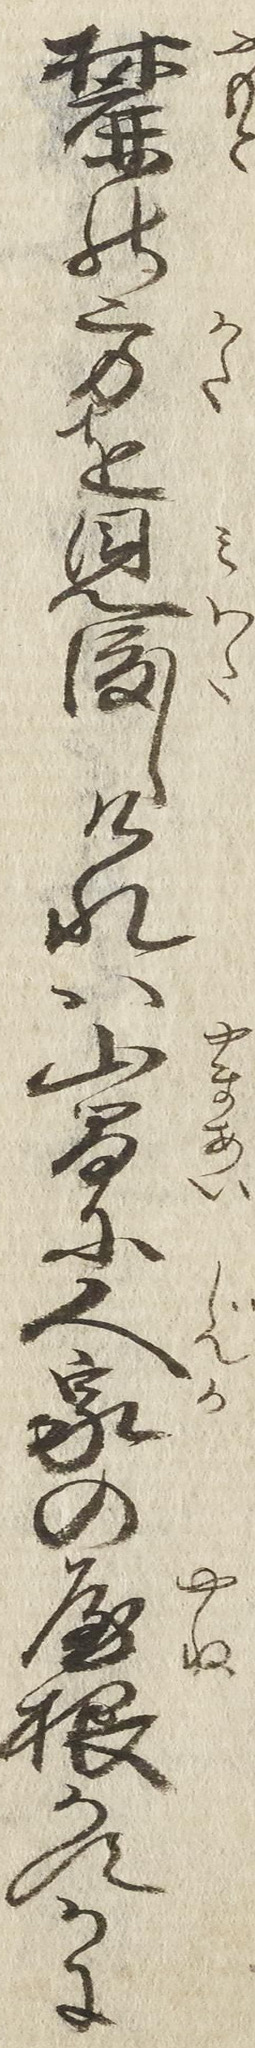麓の方を見渡しけれは山間に人家の屋根かすかに
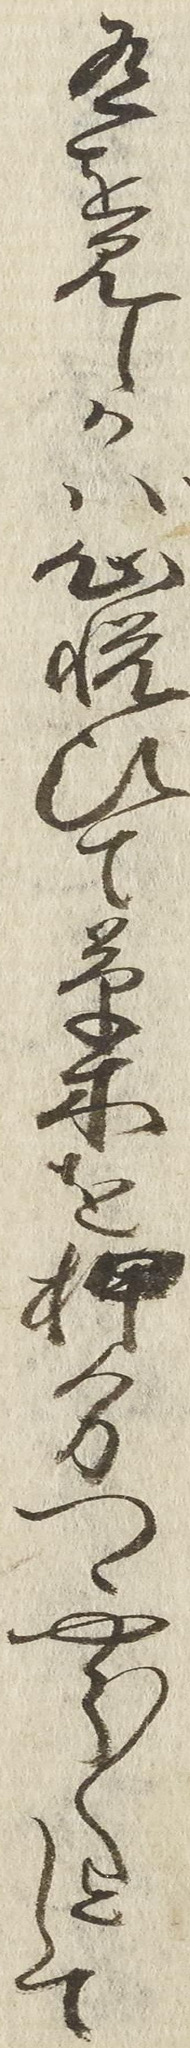有を見しかば心悦ひて草木を押分つゝやう〳〵として
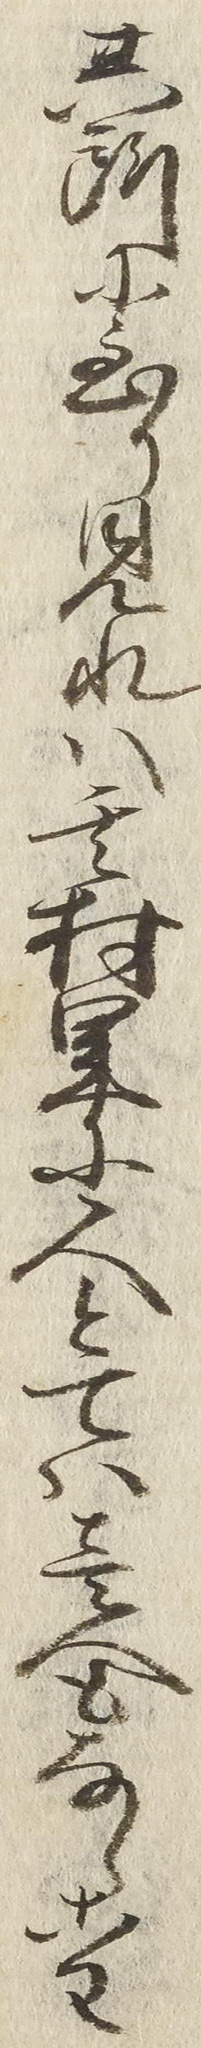其所に至り見れは其村里に人とては壱人もなしこわ
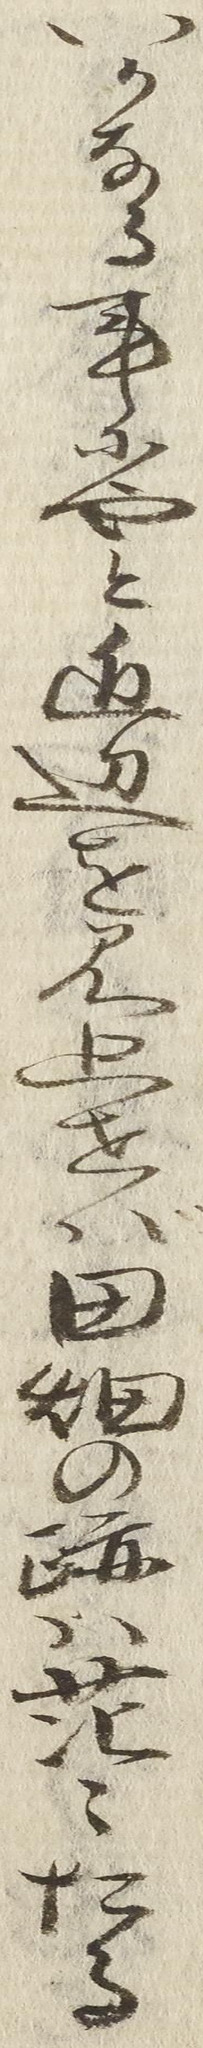いかなる事にやと近辺を見廻せば田畑の跡は茫〻たる
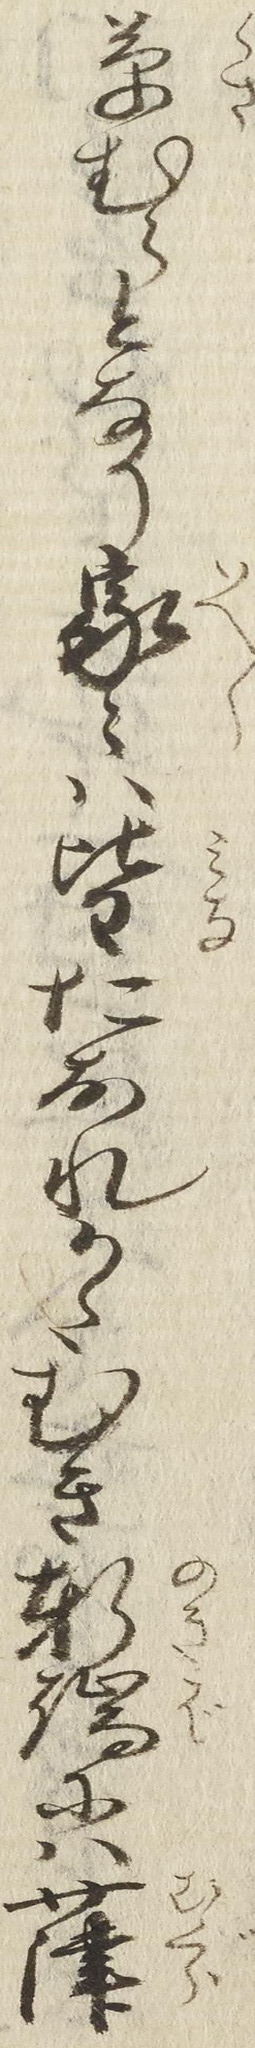草むらとなり家〻は皆たおれかたむき軒端には葏
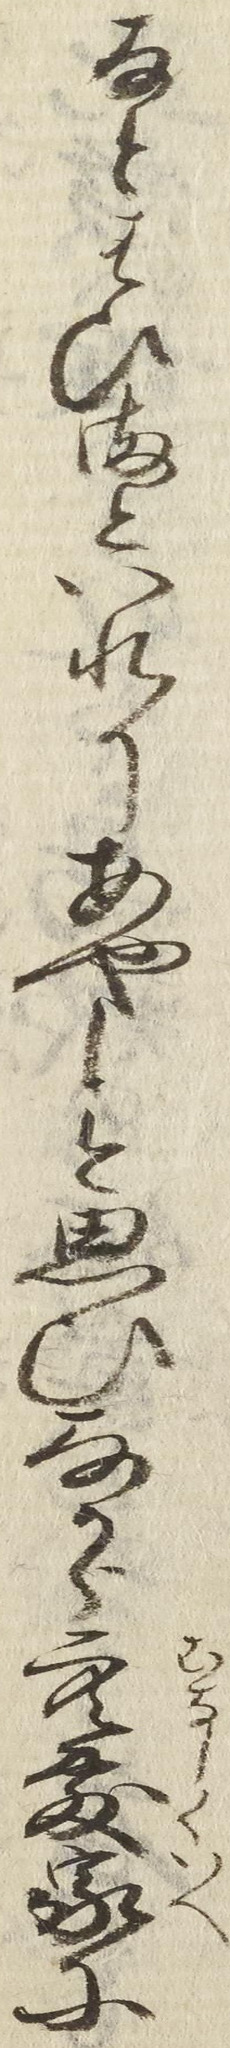なとはひまといれりあやしと思ひなから空敷家に
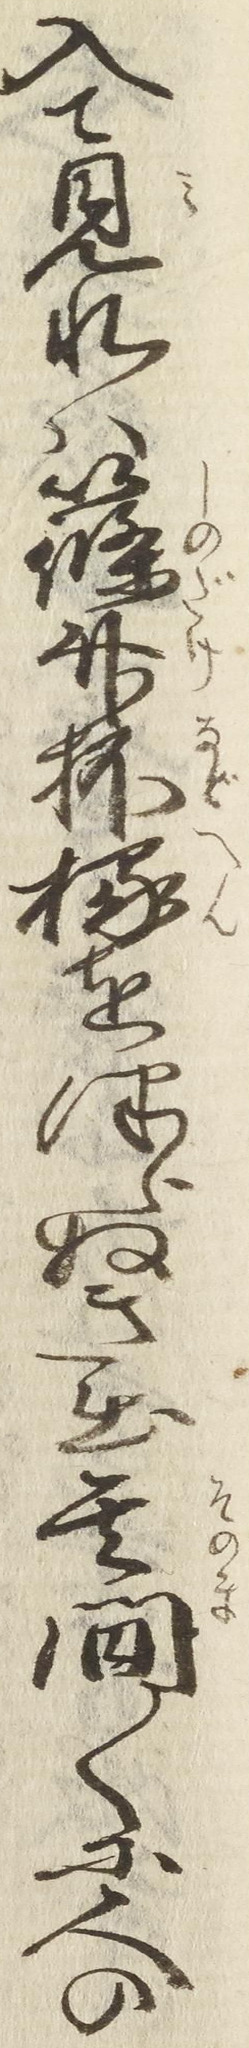入て見れは篠竹抔椽をつらぬき出其間〳〵に人の
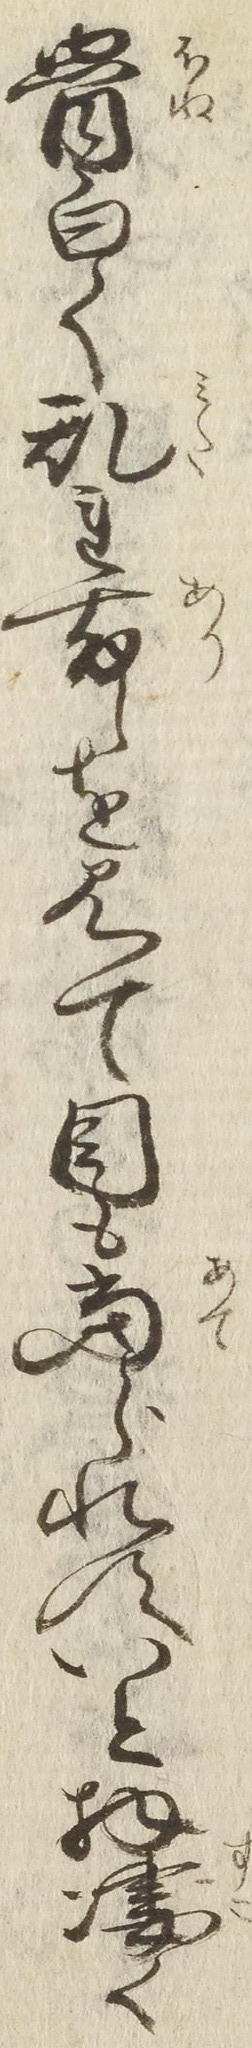骨白く乱れ有を見て目も当られすいと物凄く
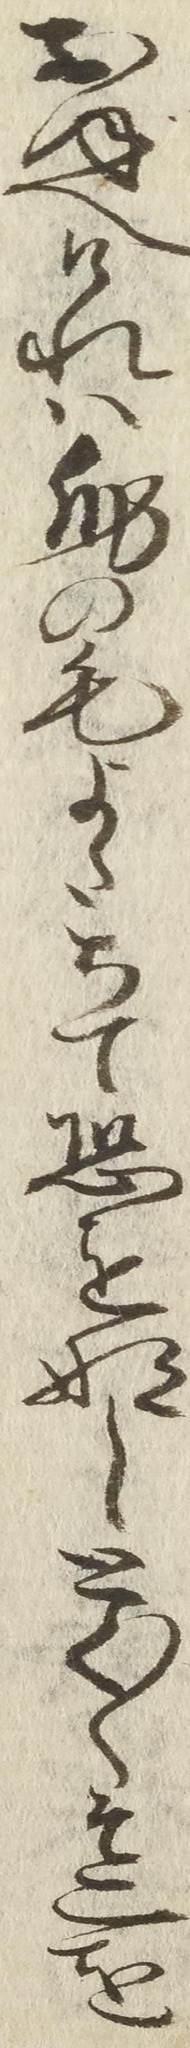おぼへけれは身の毛よたちて恐をなしとく〳〵そこを
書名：天明奇畧　全
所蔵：東京大学地震研究所図書室 Earthquake Research Institute Library, The University of Tokyo, JAPAN
